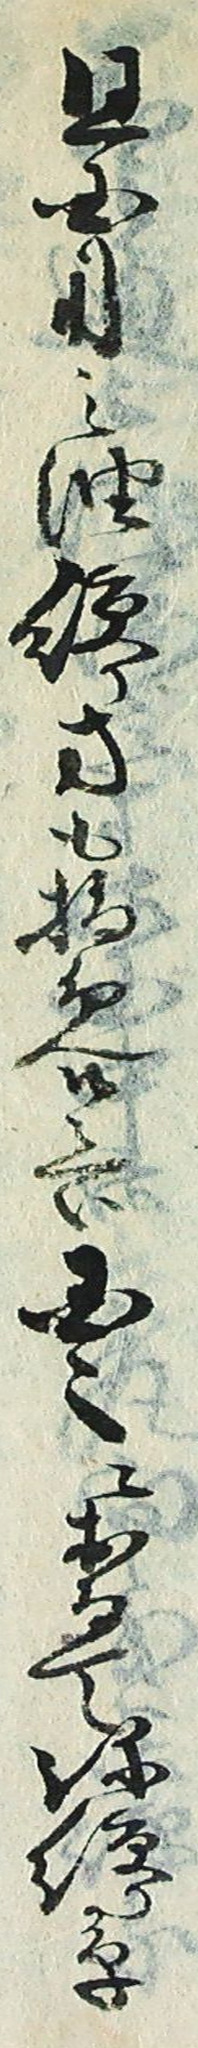且国用之油絞り方も指免候上は国々において弥絞り草
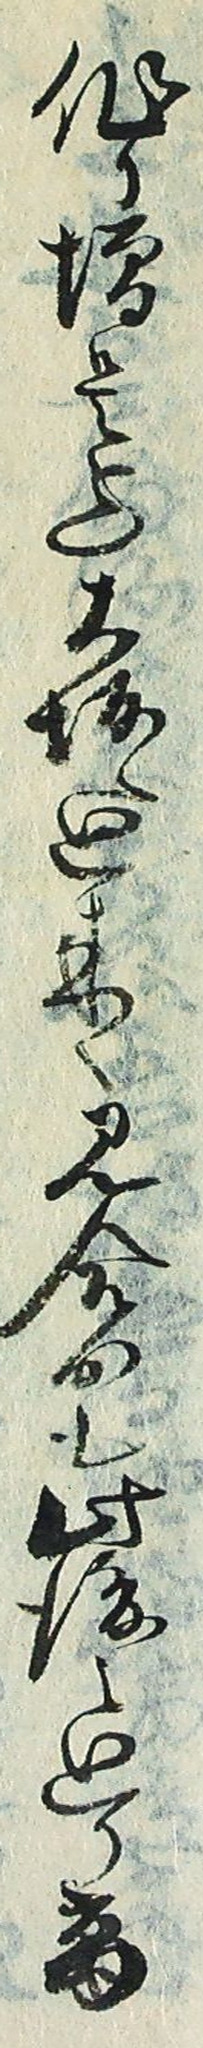作り増是迄大坂へ廻来候見合ゟも此後之廻り商
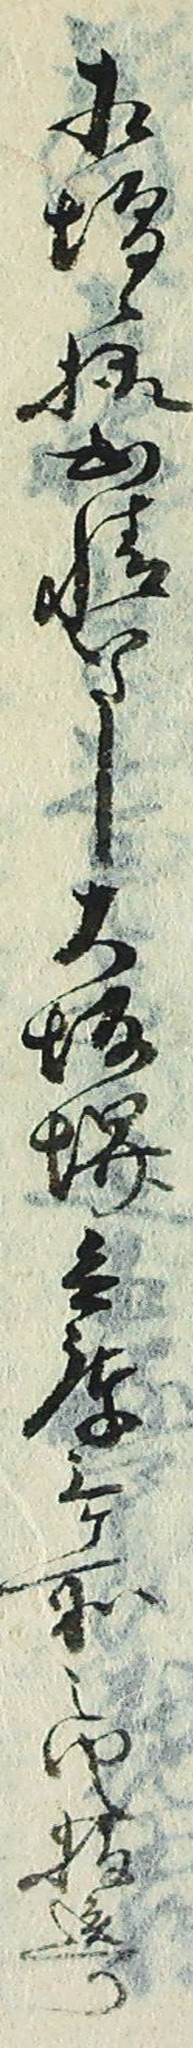相増候様出情いたし大坂堺兵庫三ケ所之内へ指送り
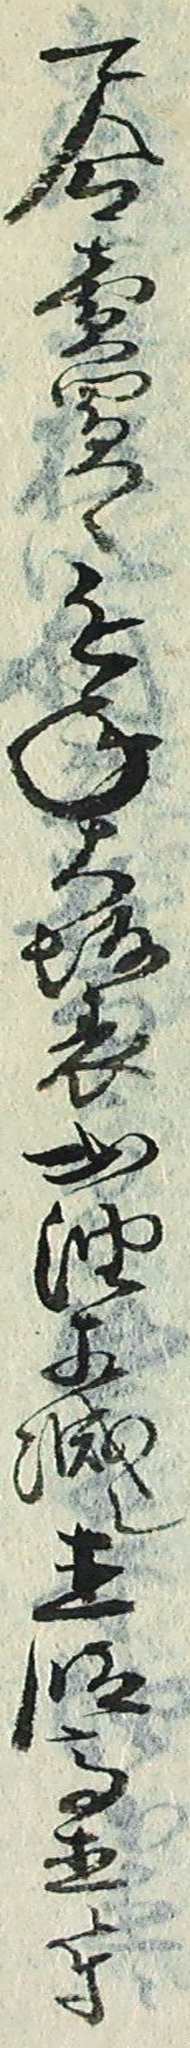可令売買候近年大坂表出油相減し直段高直に付
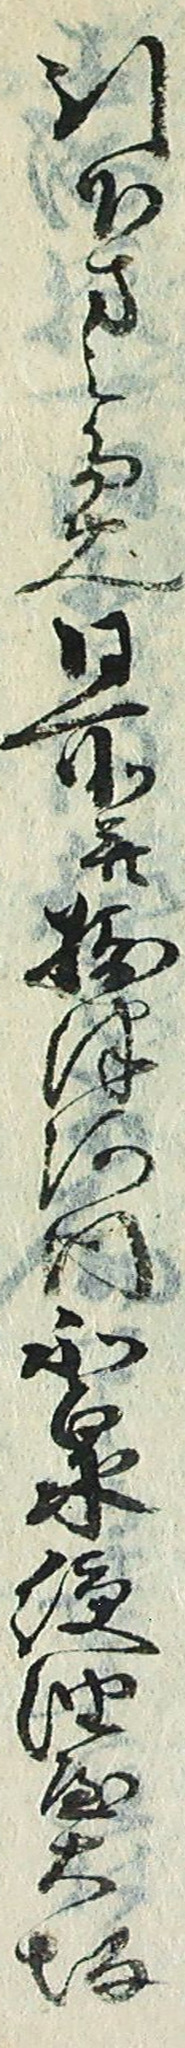引下方之ため同所幷摂津河内和泉絞油屋大坂
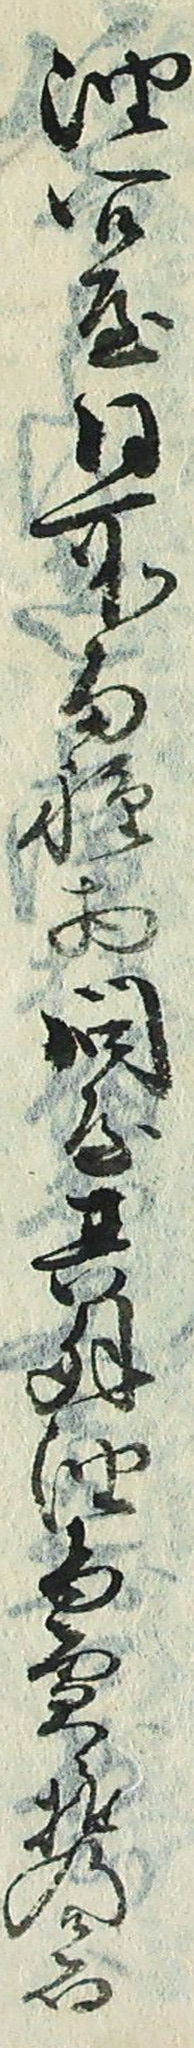油問屋同所両種物問屋其外油者商売に携候者
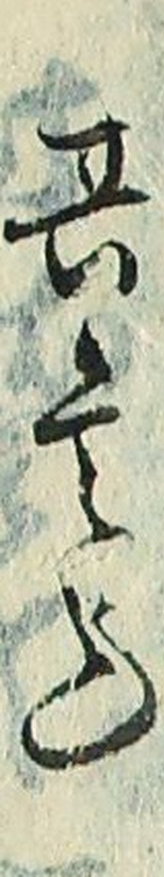共是迄
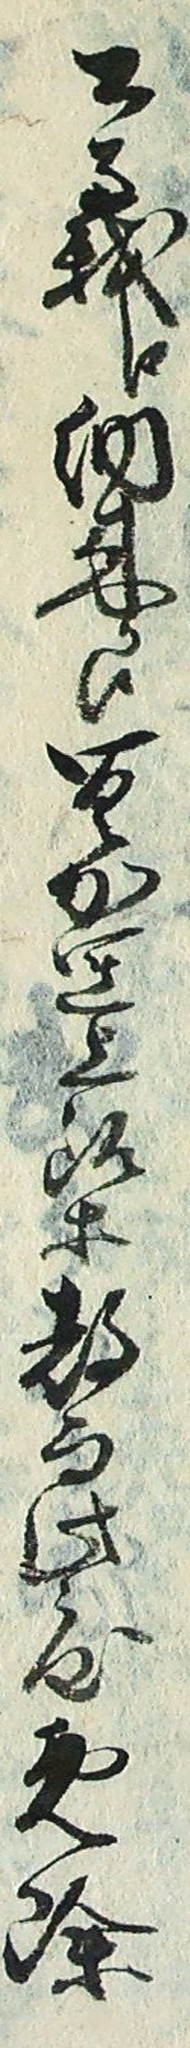公義江納来り候冥加運上銀等都而此度免除
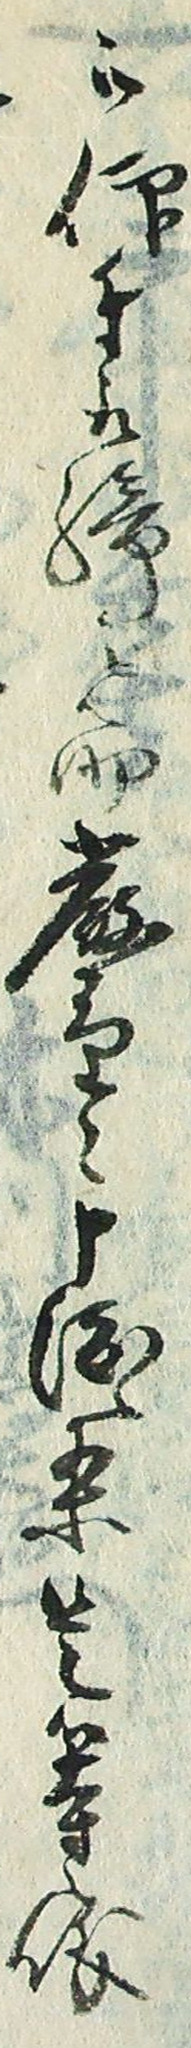被仰付取締之筋厳重に申渡候条是等之儀
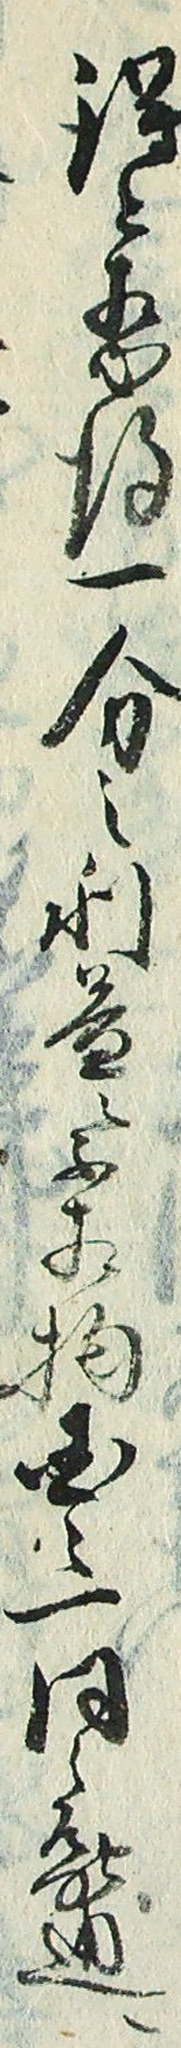得と相心得一分之利益に不相拘国々一同之融通へ
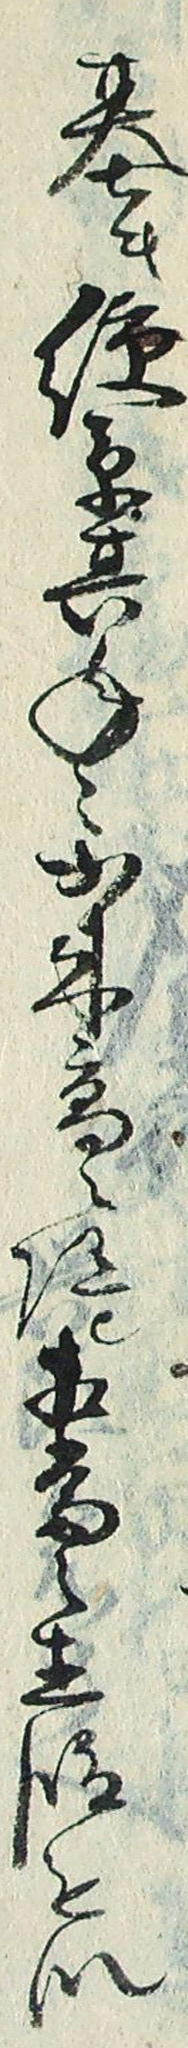基き絞草其年之出来高に随ひ相当の直段を以

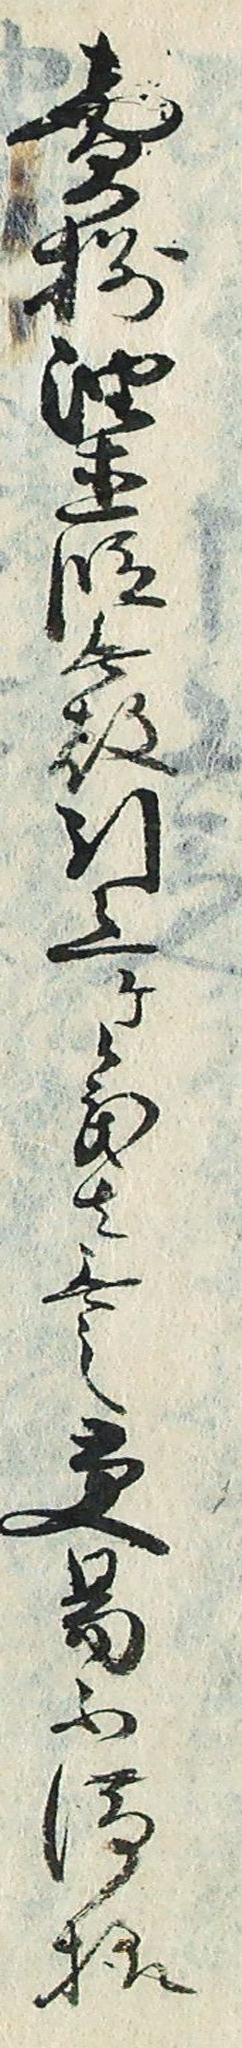売捌油直段無故引上け候義者無之交易不滞様
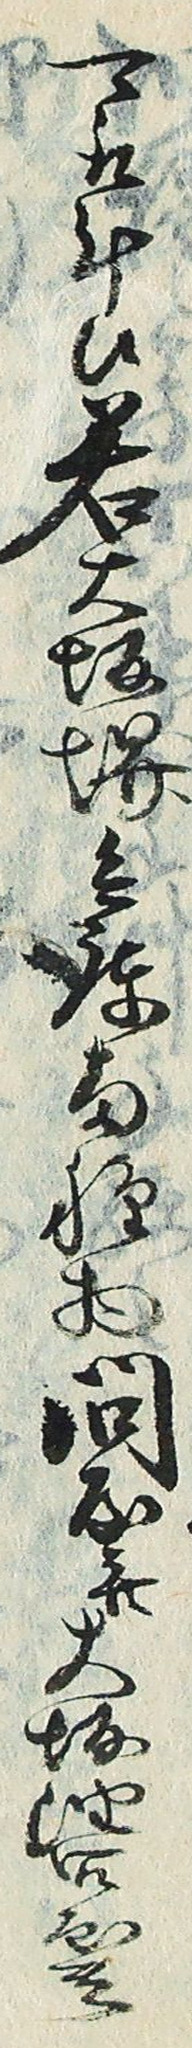可取計候若大坂堺兵庫両種物問屋幷大坂油問屋共
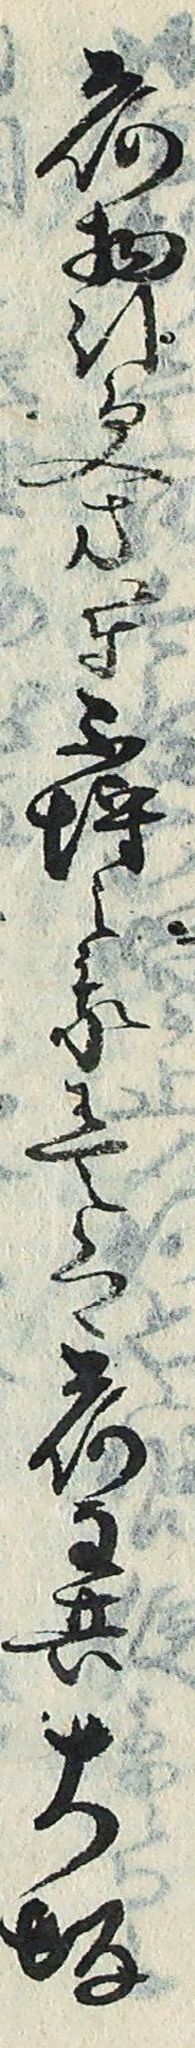荷物引取受方に付不埒之義有之候はゝ荷主共大坂
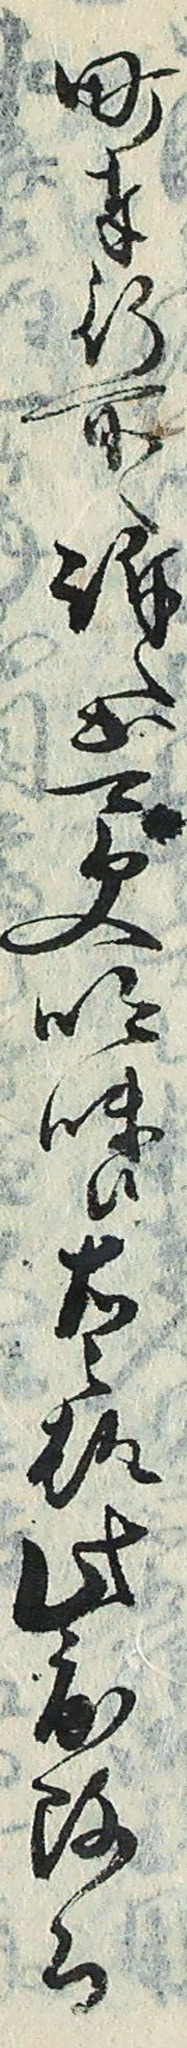町奉行所訴へ出可受吟味候右之趣此度改而
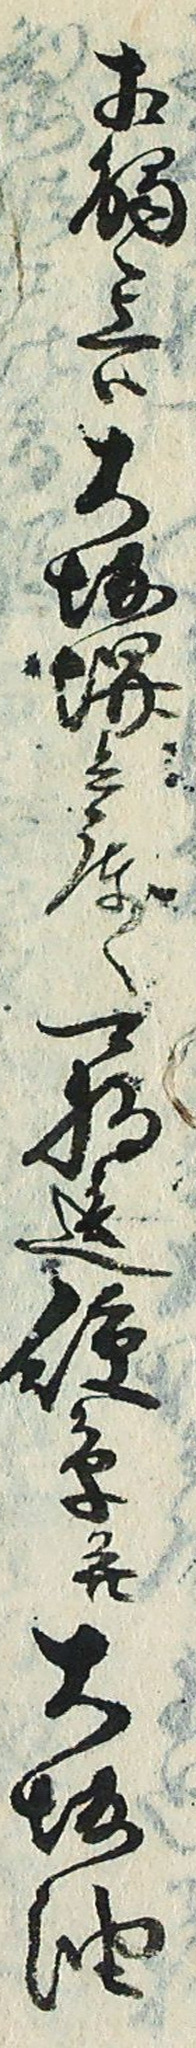相触候上は大坂堺兵庫へ可指送絞草幷大坂油
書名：油稼御取究ニ附御箇條書テ以被仰渡南北同役申談御答書控
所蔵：鳴門教育大学 Naruto University of Education
